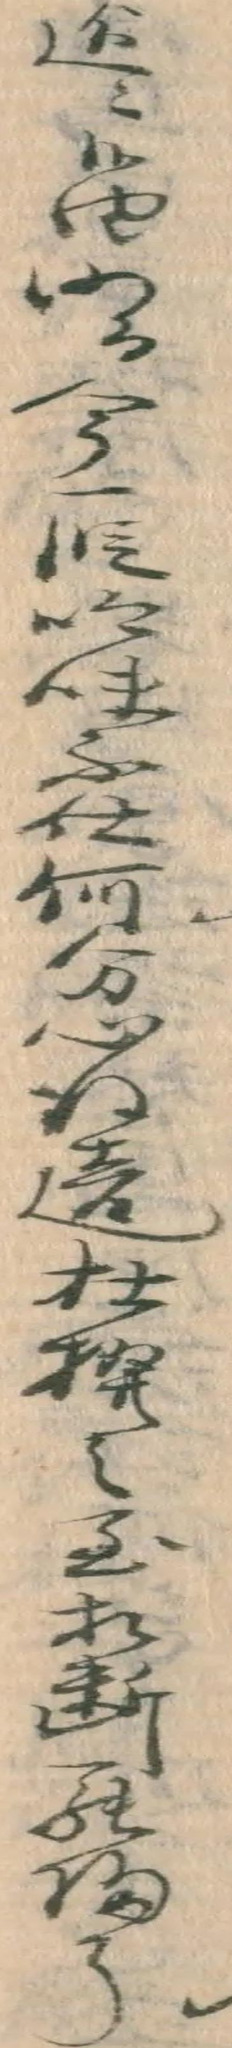迄ニ候由仍而今一段吟味不仕何分心得違杜撰之至相断罷帰了
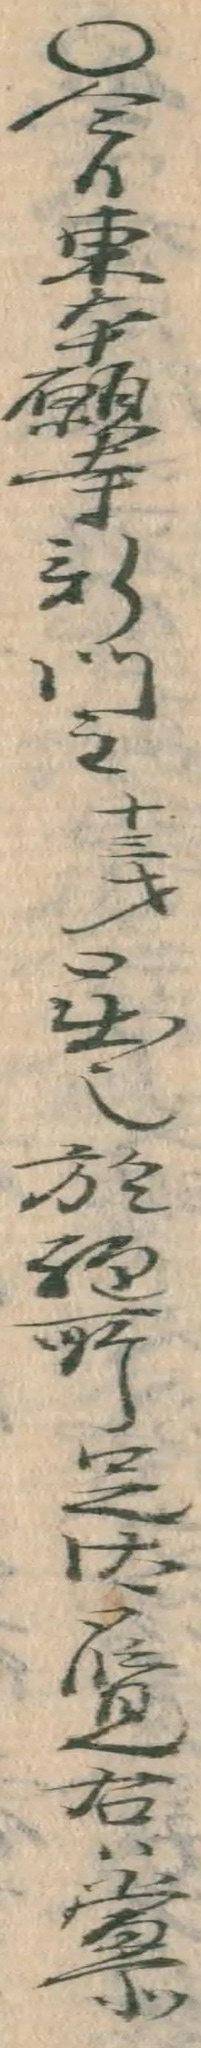○今日東本願寺新門主十三才御出也於経所足汰御覧右は當所
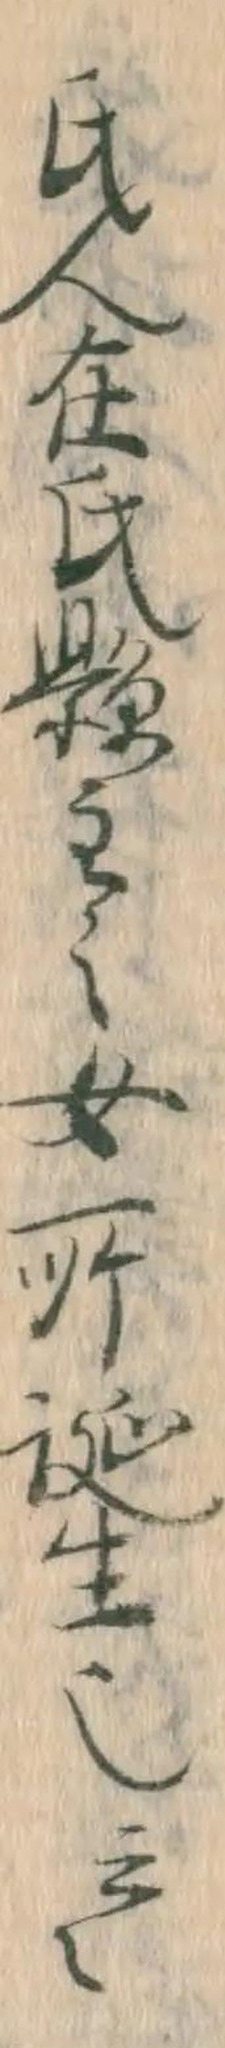氏人在氏縣主之女所誕生也云々
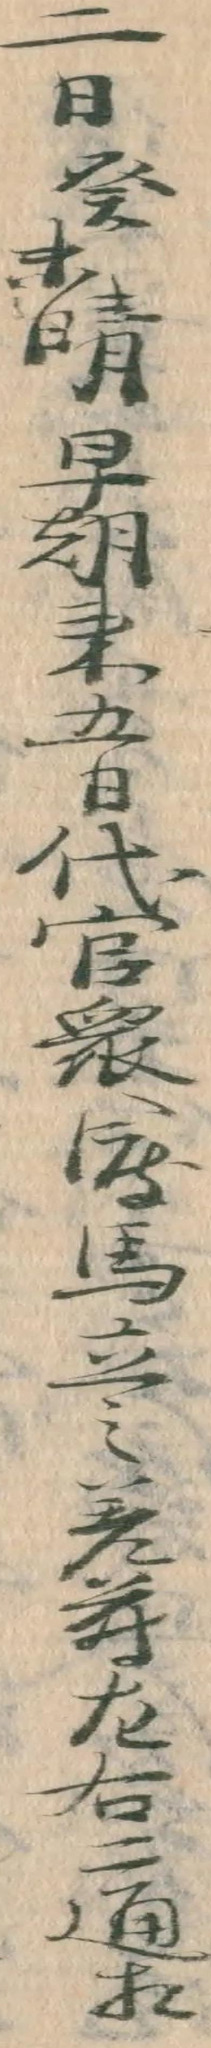二日癸未晴早朝来五日代官衆へ渡馬立之差符左右二通相
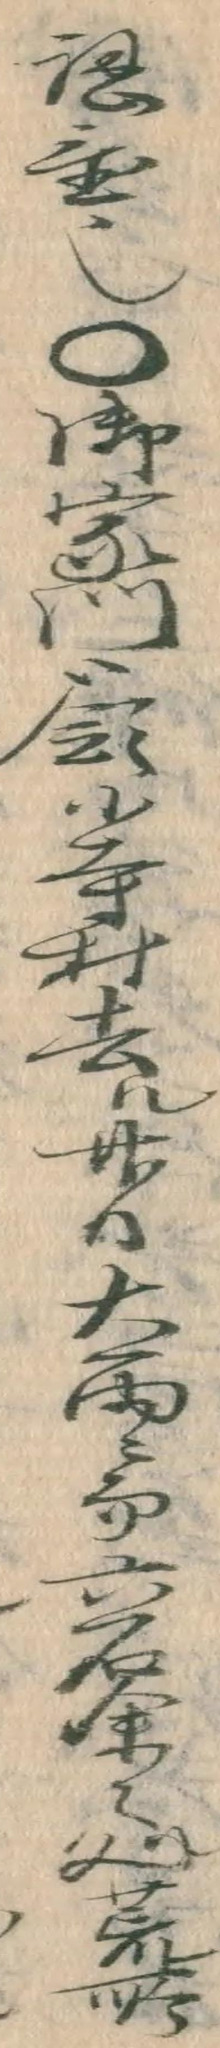認置也○御家門御領小寺村去ル廿日大雨二而六石余之処荒所
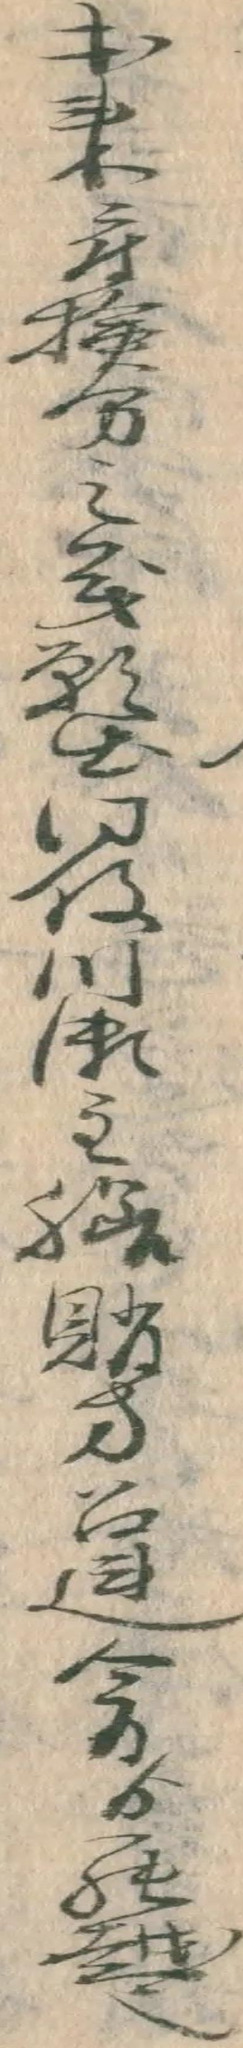本来ニ付検分之義願出同役川瀬主膳賄方召連今日ゟ罷越也
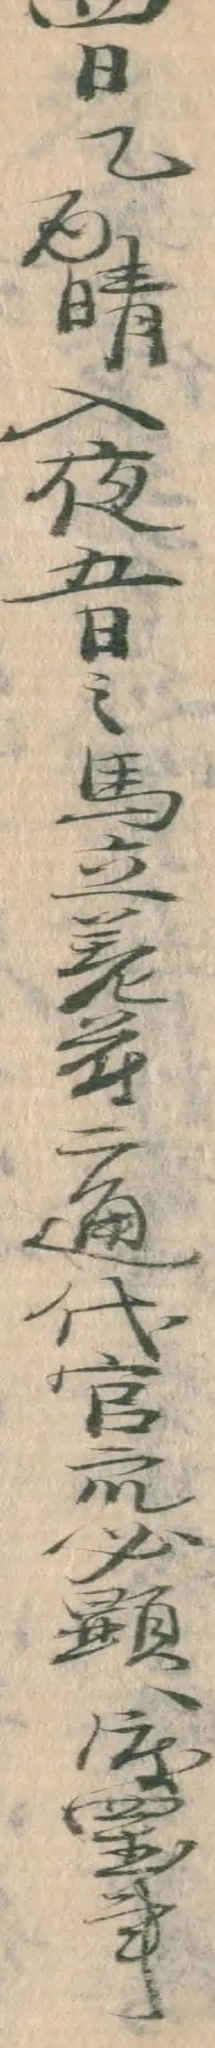四日乙巳晴入夜五日之馬立差符二通代官衆必顕へ渡置事
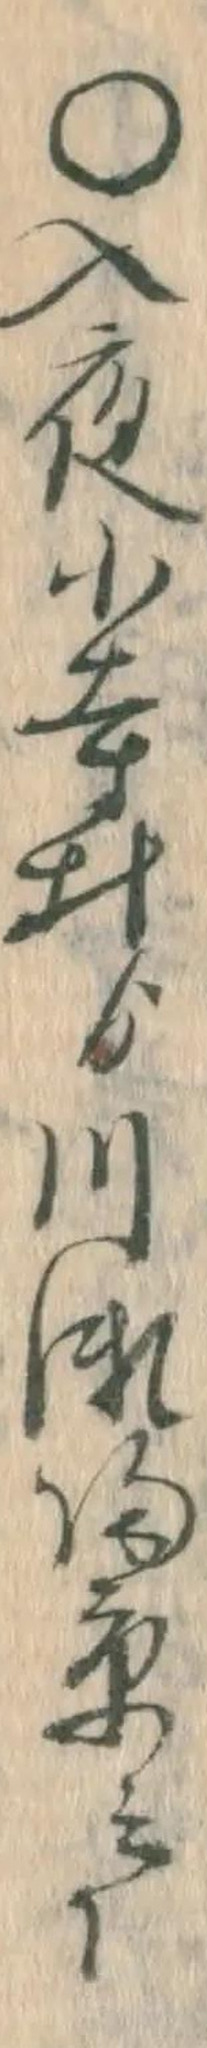○入夜小寺村ゟ川瀬帰京之方
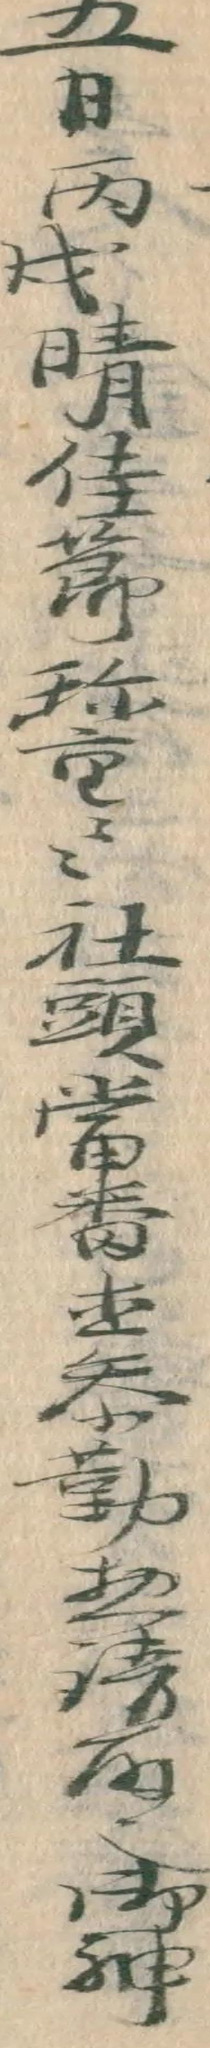五日丙戌晴佳節珍重々々社頭當番直参勤惣請取也御神
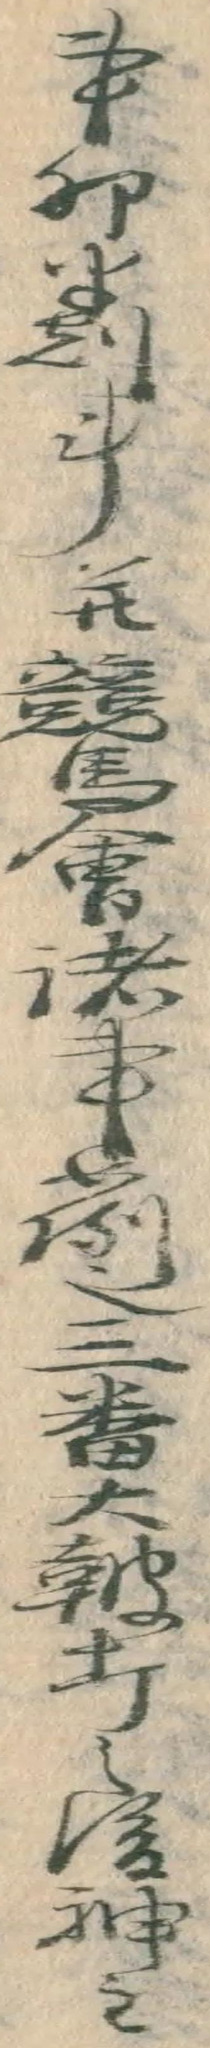事卯半刻斗并競馬會諸事如例三番大鼓打之後神主
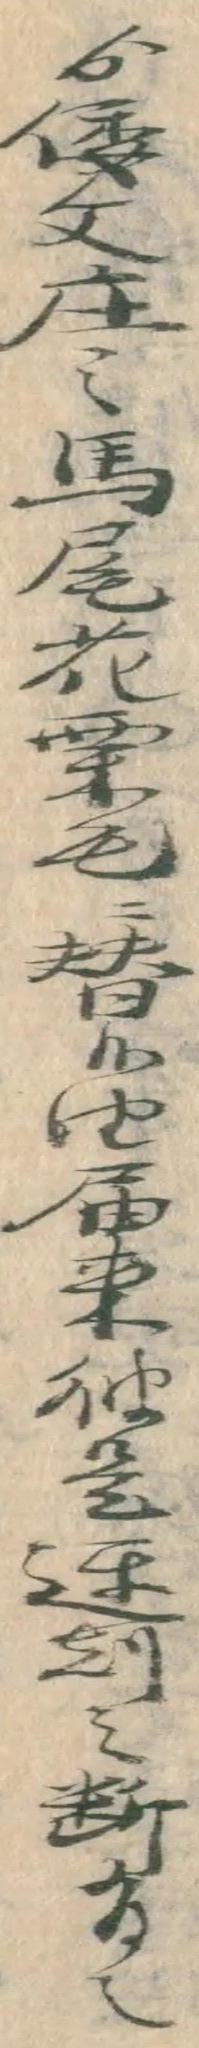ゟ倭文庄之馬尾花粟毛ニ替候由届来彼是遅刻之断有之
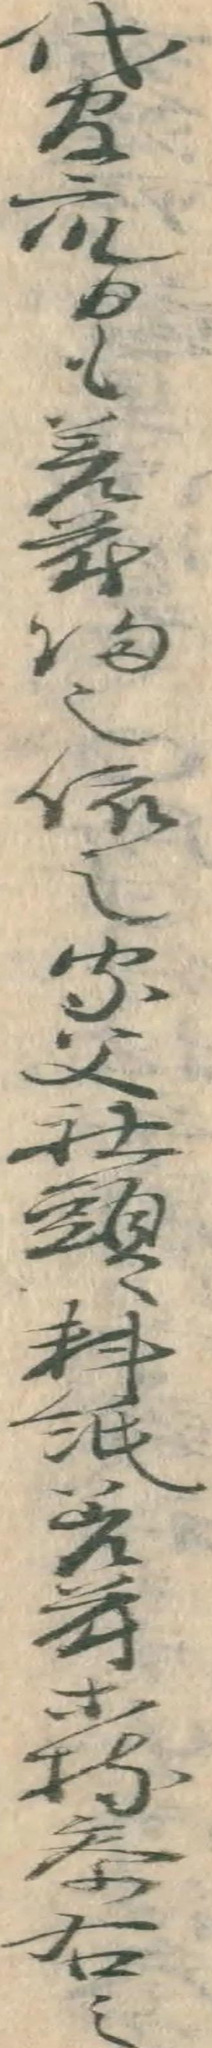代官衆ゟも差符帰也依之家父社頭へ料紙差符等持参右之
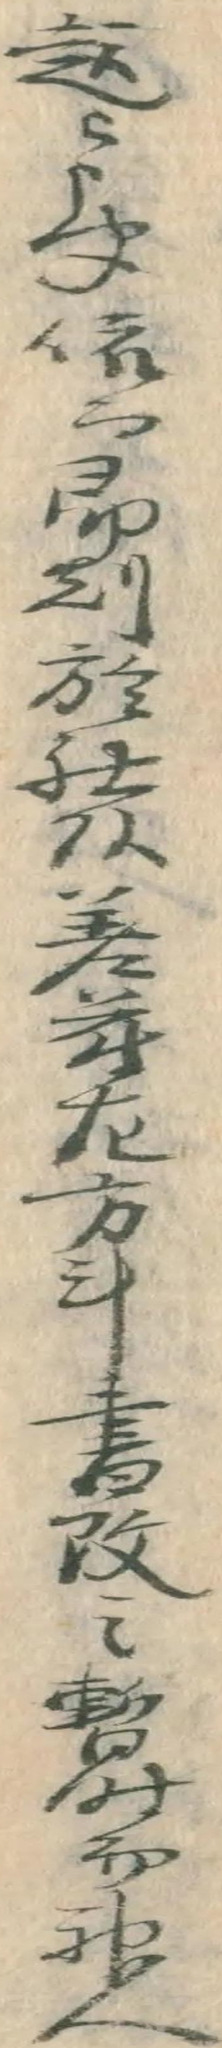趣被申聞依而即刻於社頭差符左方斗書改之暫時而神人

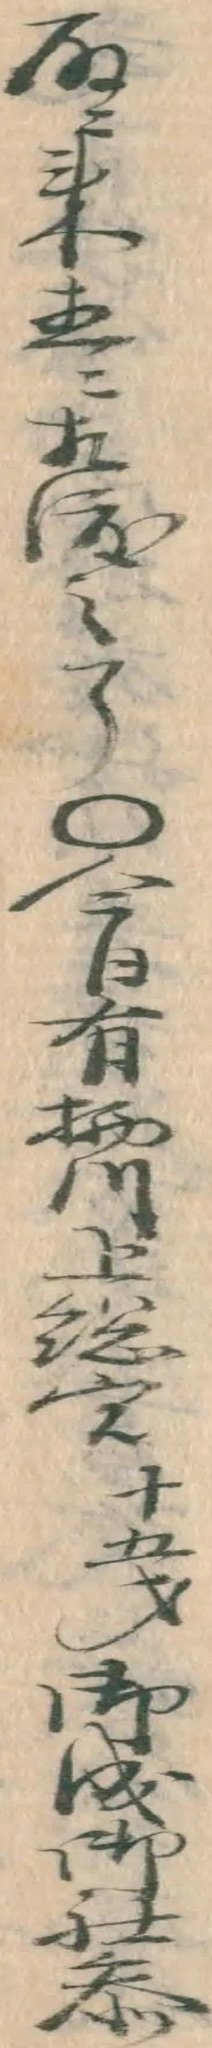取ニ来直ニ相渡之了○今日有栖川上総宮十五才御成御社参
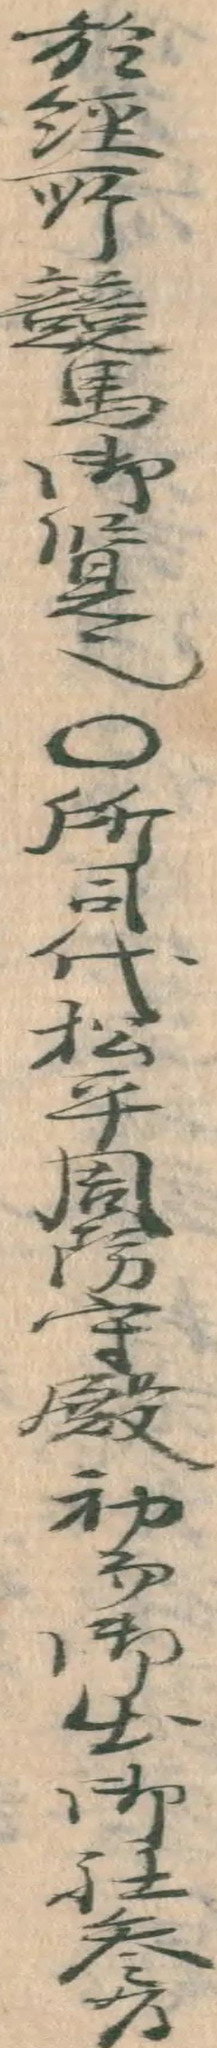於経所競馬御覧也〇所司代松平周防守殿初而御出御社参有
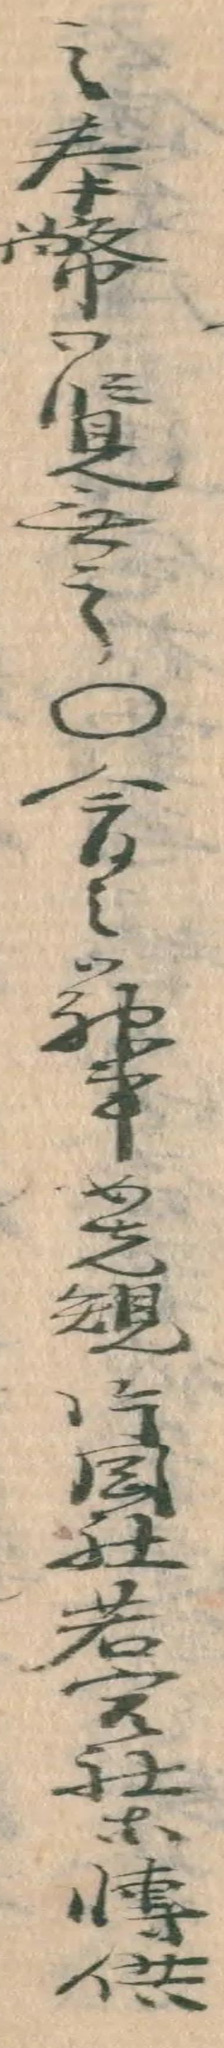之奉幣御覧無之〇今日之御神事如先規片岡社若宮社等轉供
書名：賀茂社記録. 第65冊
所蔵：国立国会図書館 National Diet Library, JAPAN
